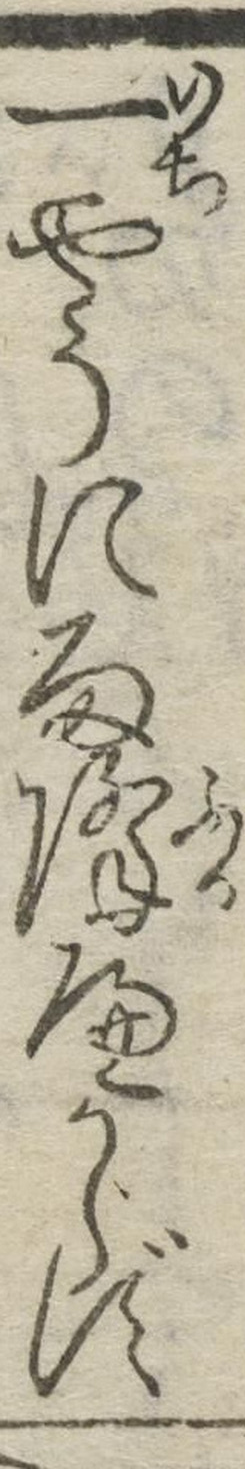一やうに雨降へからず
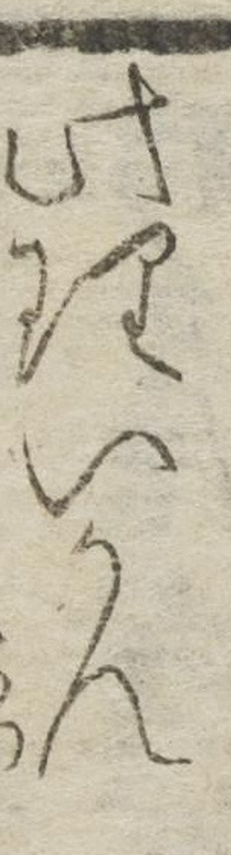此理いかん
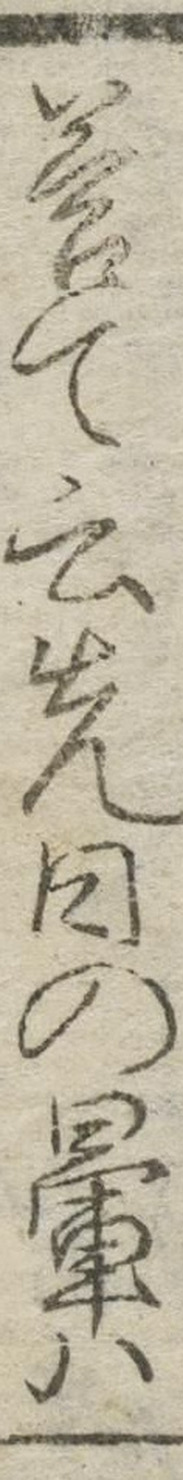答て云先日の暈は
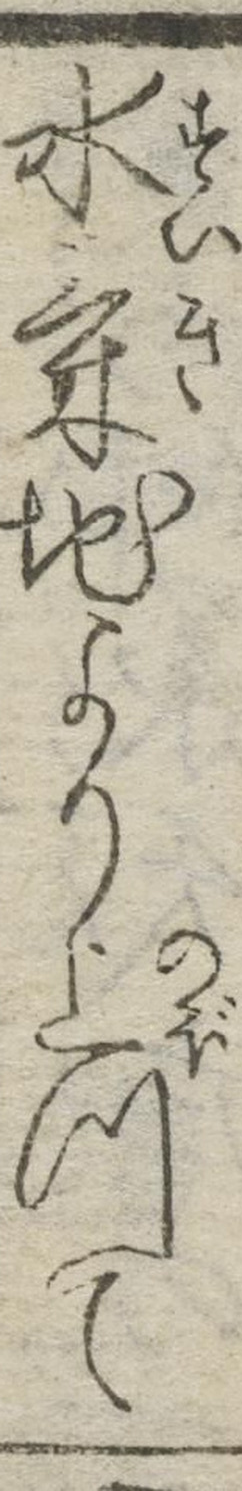水気地より上つて
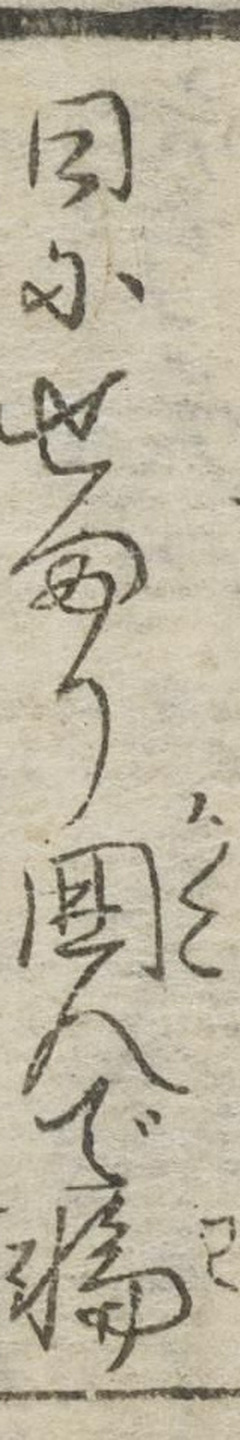日にせまり囲んで輪
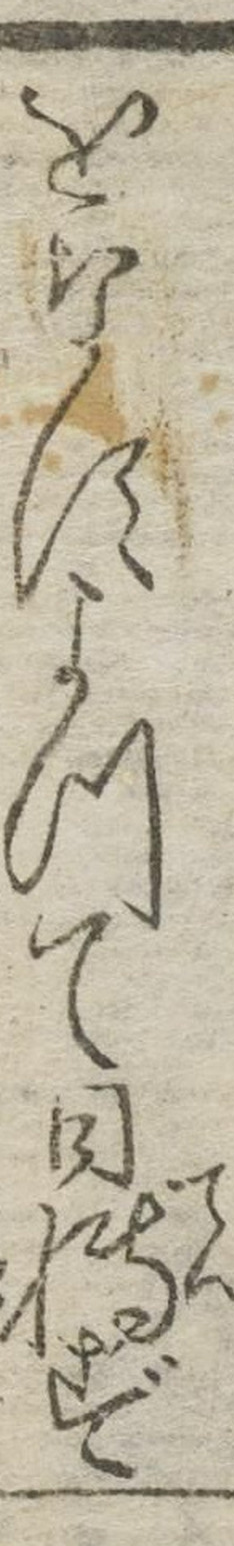をなすよつて日転ず
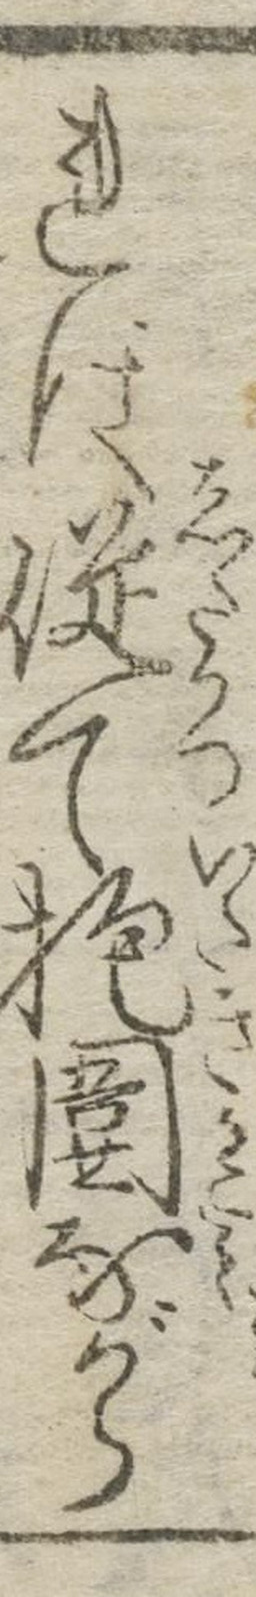れば従て抱囲ながら
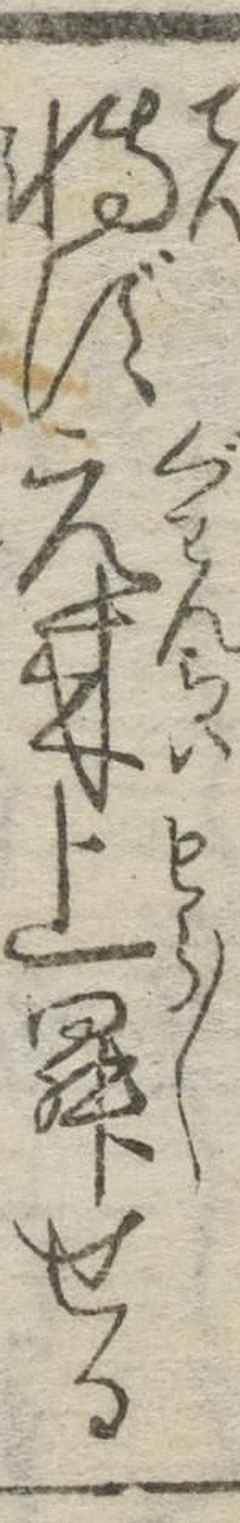転ず元来上昇せる
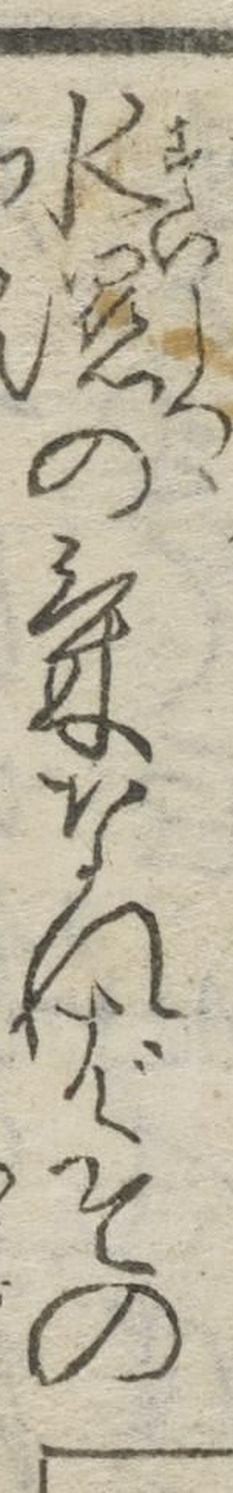水湿の気なればその
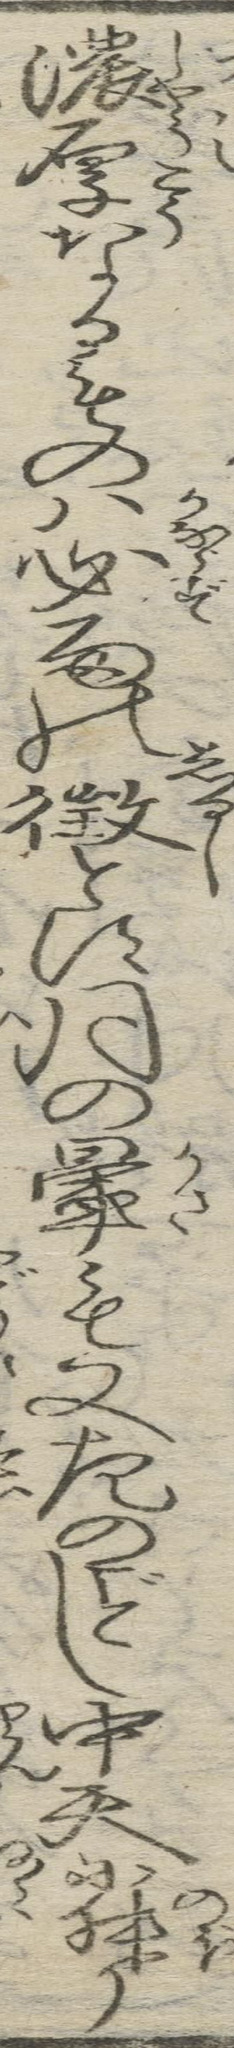濃厚なるものは必雨の徴とす月の暈も又左のごとし中天に升り
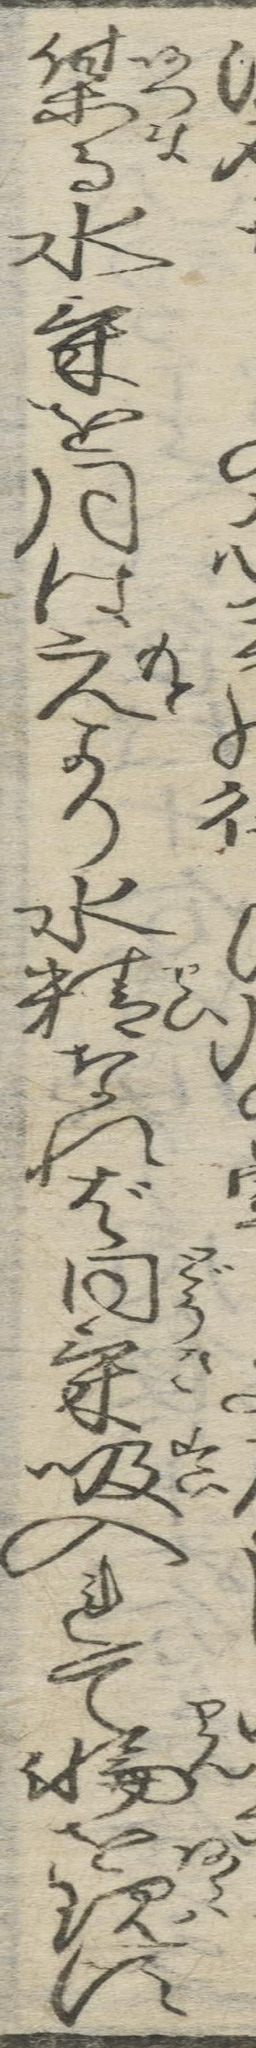集る水気を月は元より水精なれば同気吸入れて輪を現す
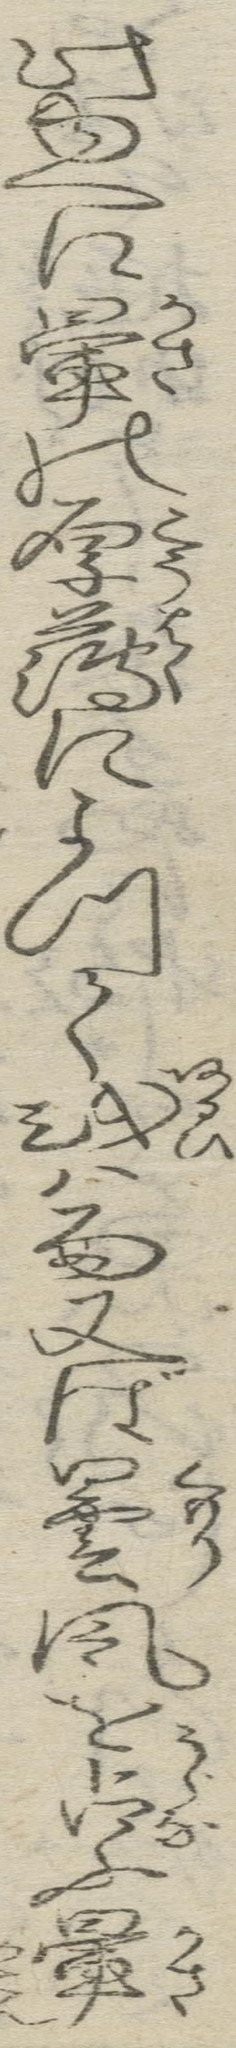此ゆへに暈の厚薄によつて或は雨又は曇風を占ふ暈
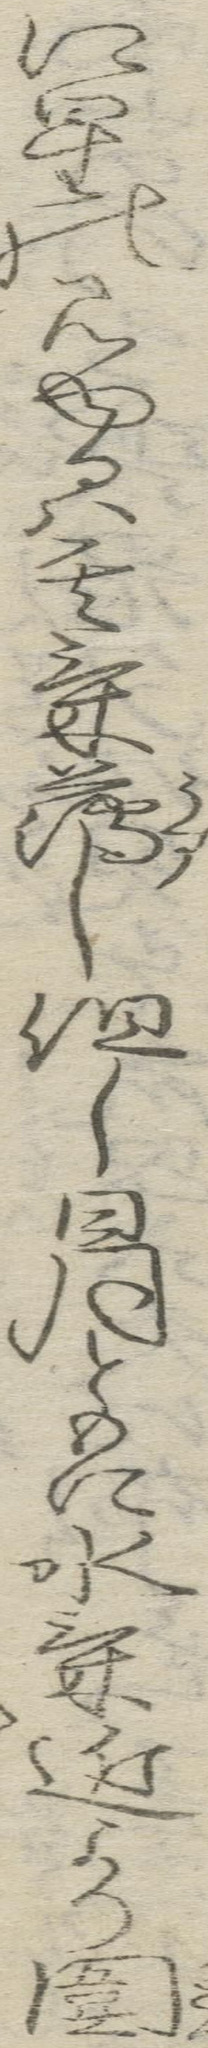に星の見ゆるは其気薄し但し日月ともに水気近より囲
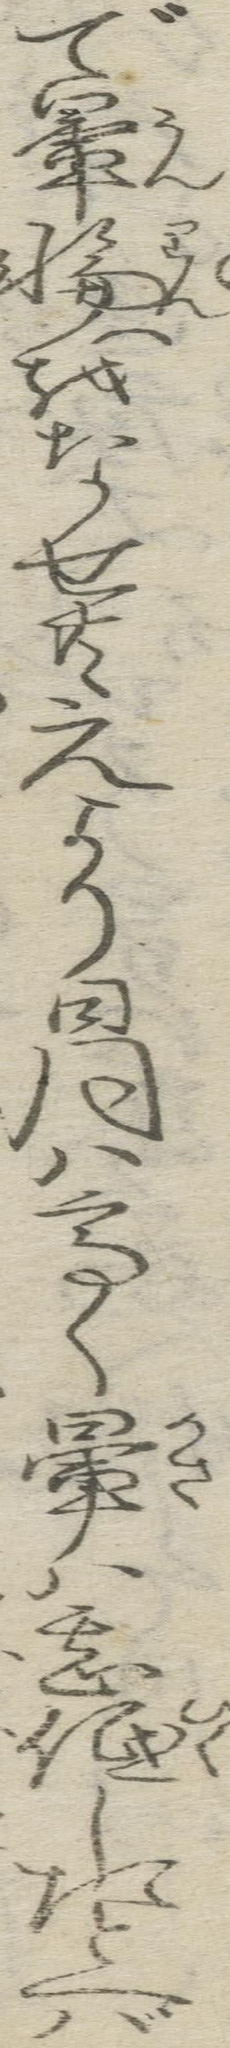で暈輪をなせ共元より日月は高く暈は甚低したとへば
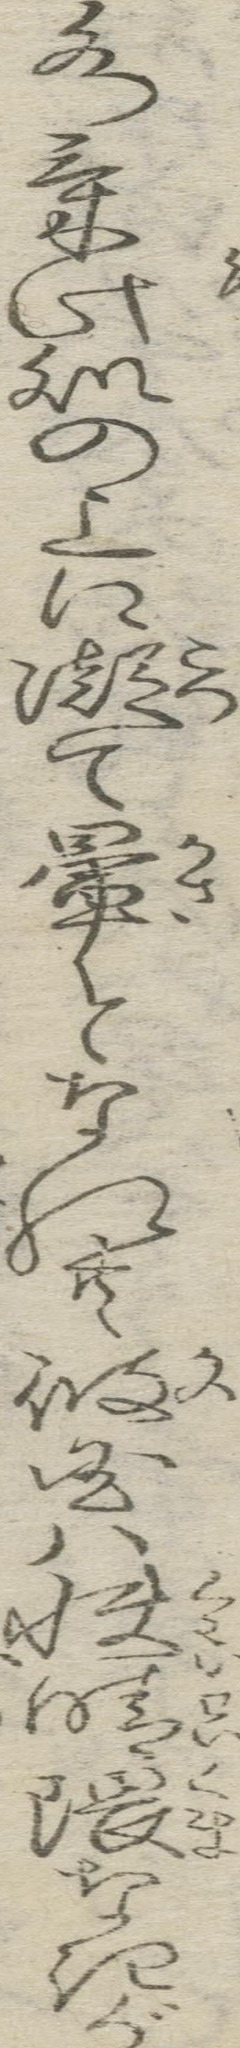水気此処の上に凝て暈となれ共彼国は快晴隈なきが
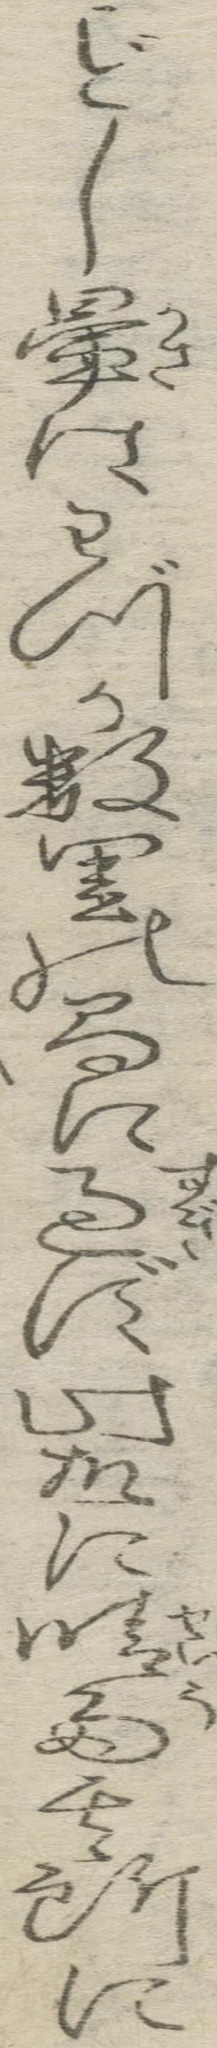ごとし暈はわづか数里の間に過ず此故に晴雨其所に
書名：訓蒙天地辨　天
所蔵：東京大学地震研究所図書室 Earthquake Research Institute Library, The University of Tokyo, JAPAN
